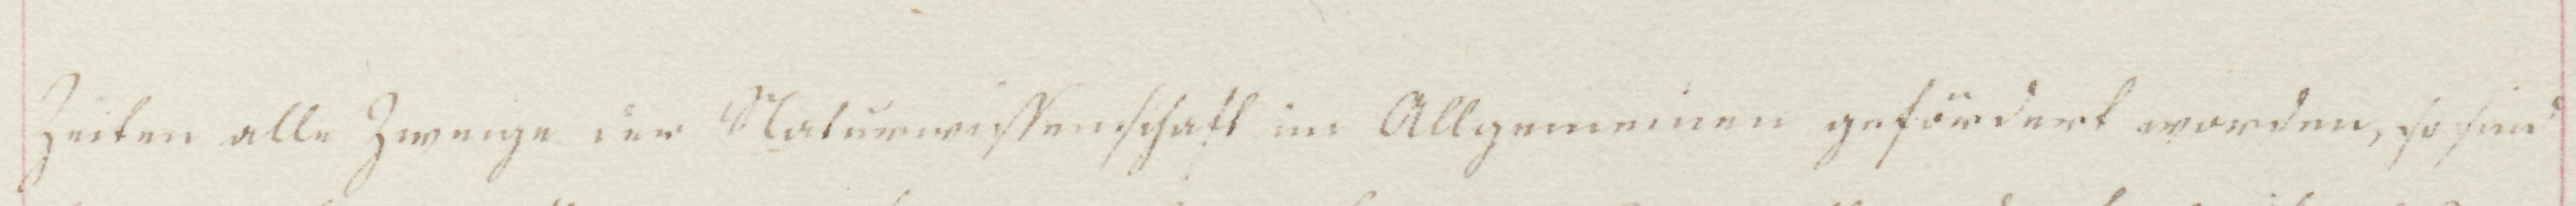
Zeiten alle Zweige der Naturwissenschaft im Allgemeinen gefördert worden, so sind
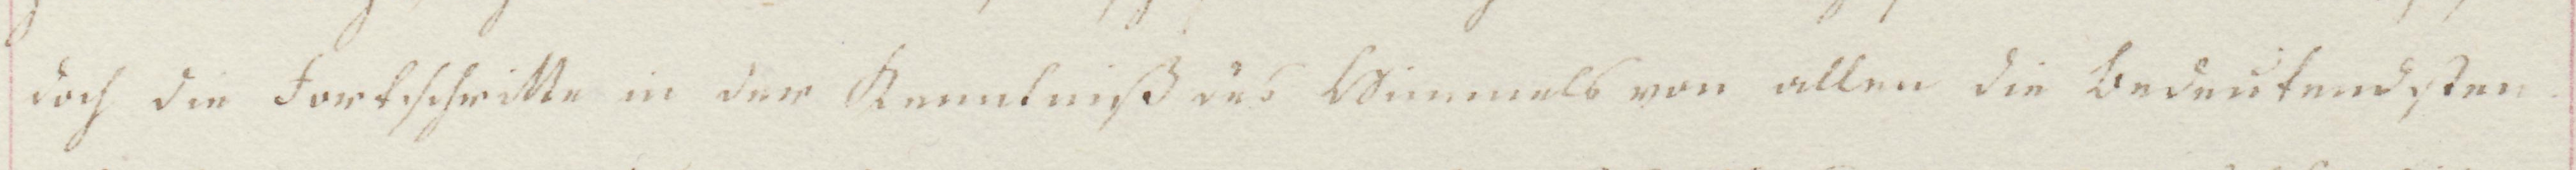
doch die Fortschritte in der Kenntniß des Himmels von allen die Bedeutendsten.
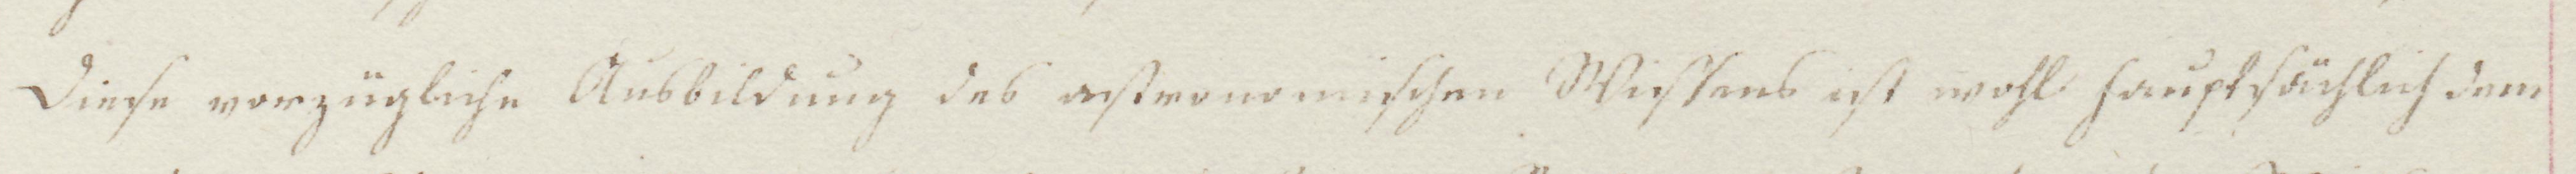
Diese vorzügliche Ausbildung des astronomischen Wissens ist wohl hauptsächlich dem
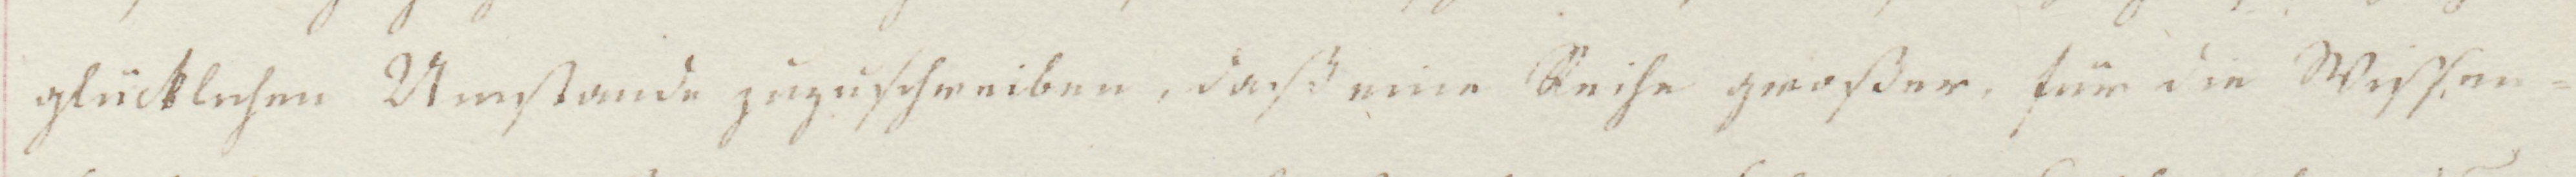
glücklichen Umstande zuzuschreiben, daß eine Reihe großer, für die Wissen-
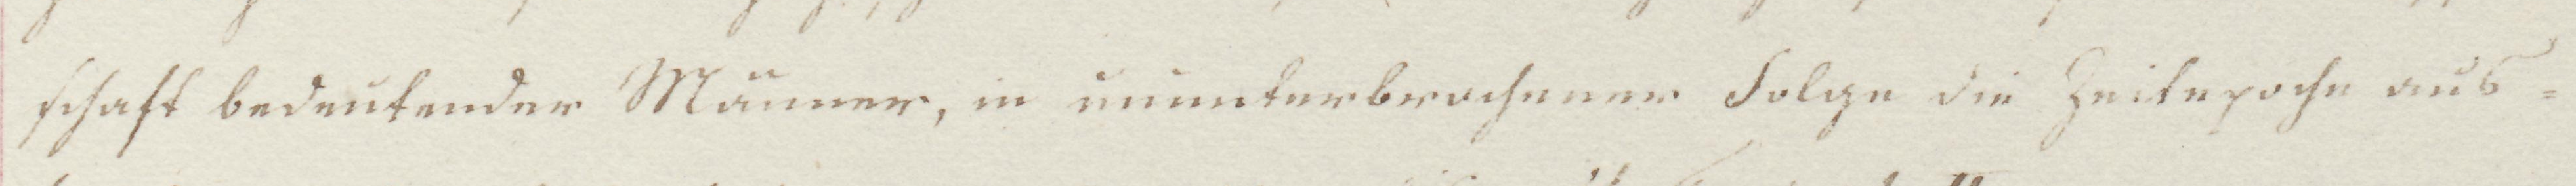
schaft bedeutender Männer, in ununterbrochener Folge die Zeitepoche aus-
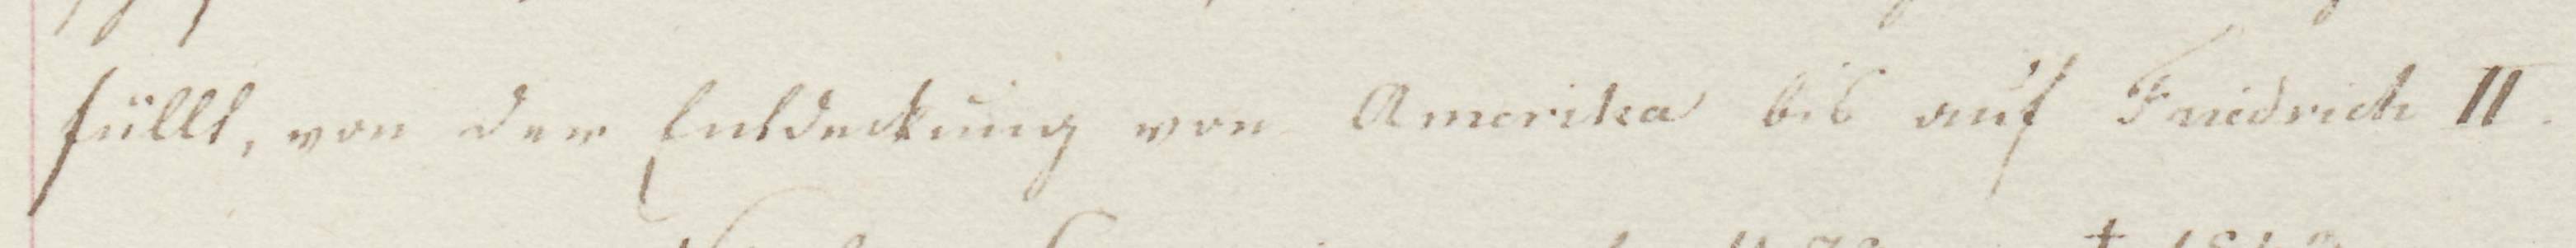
füllt, von der Entdeckung von Amerika bis auf Friedrich II.
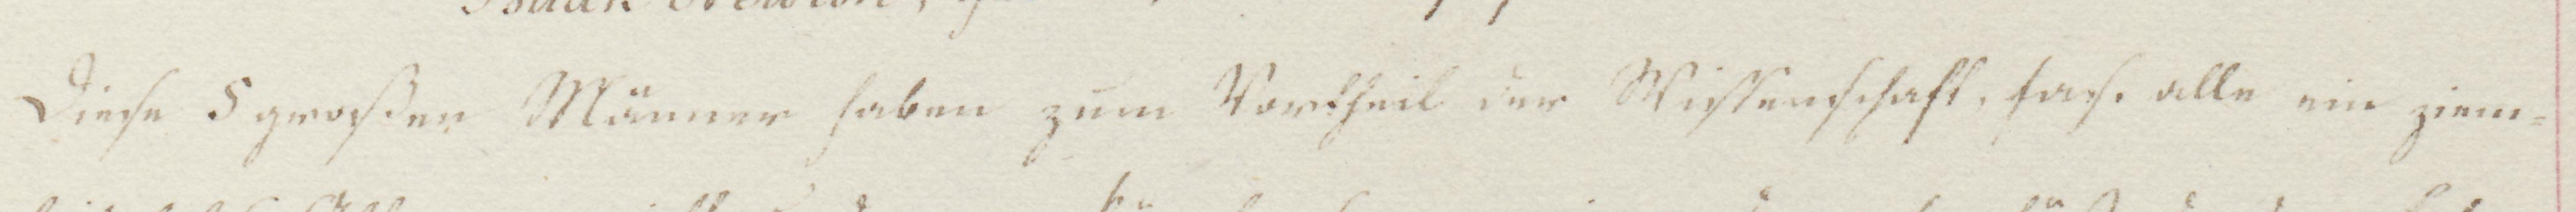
Diese 5 großen Männer haben zum Vortheil der Wissenschaft, fast alle ein ziem-
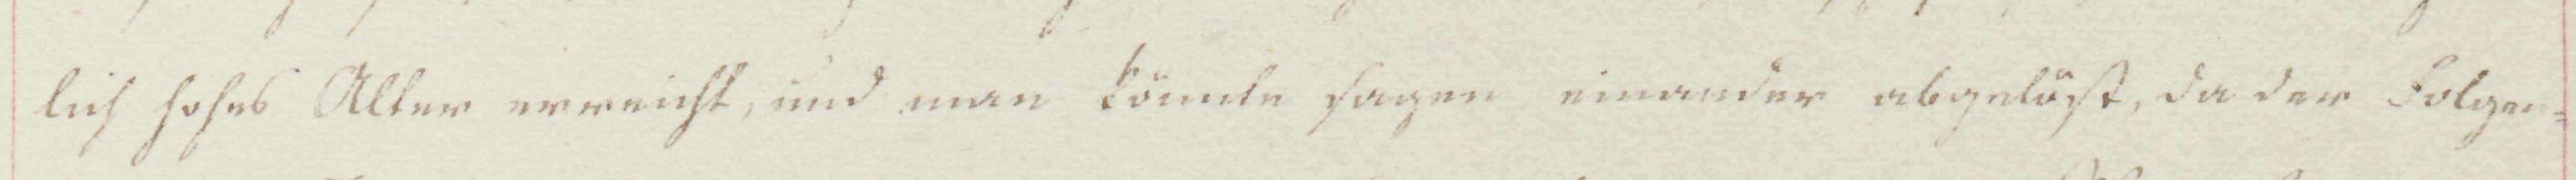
lich hohes Alter erreicht, und man könnte sagen einander abgelöst, da der Folgen-
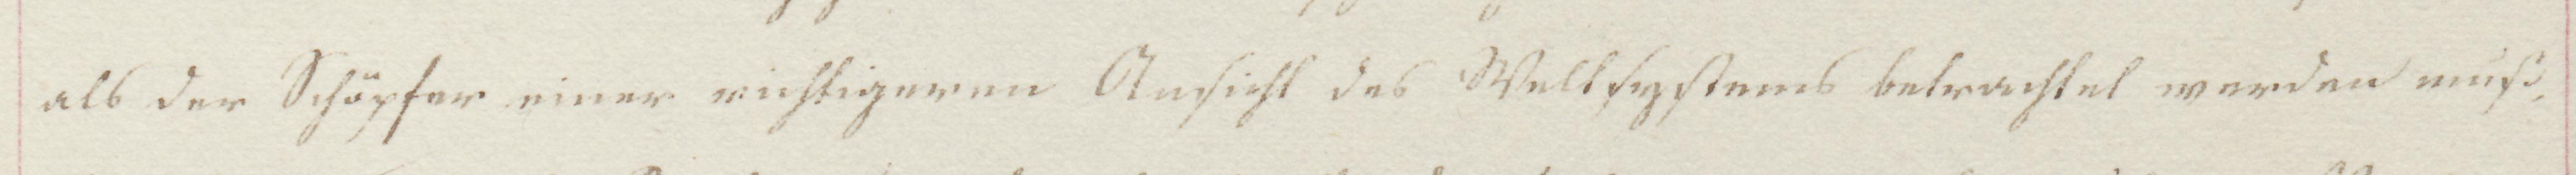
als der Schöpfer einer richtigeren Ansicht des Weltsystems betrachtet werden muß,
